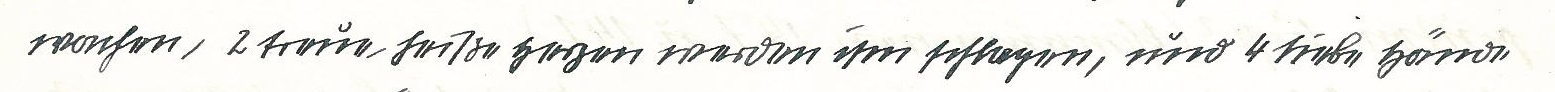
wachen, 2 treue, heiße Herzen werden ihm schlagen, und 4 liebe Hände
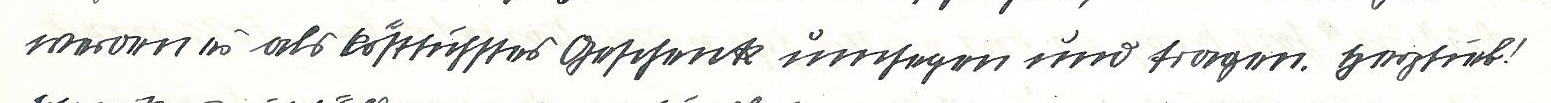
werden es als köstlichstes Geschenk umhegen und tragen. Herzlieb!
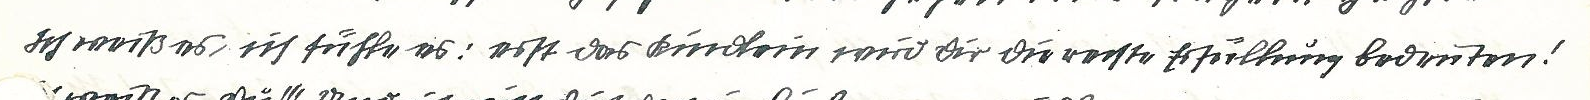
Ich weiß es, ich fühle es: erst das Kindlein wird Dir die rechte Erfüllung bedeuten!
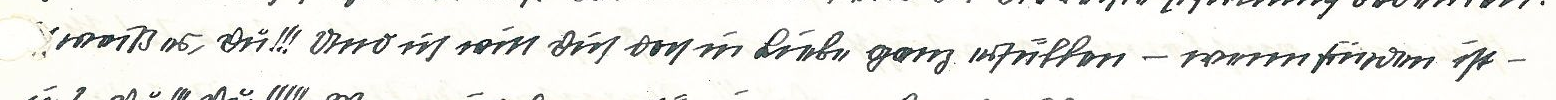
weiß es, Du!!! Und ich will Dich doch in Liebe ganz erfüllen – wenn Frieden ist –
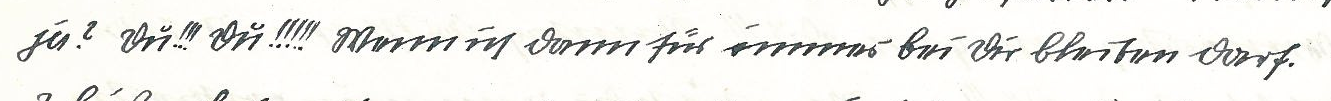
ja? Du!!! Du!!!!! Wenn ich dann für immer bei Dir bleiben darf.
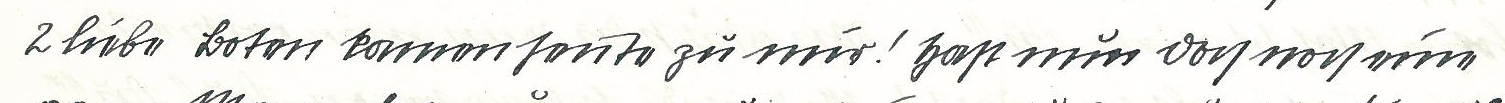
2 liebe Boten kamen heute zu mir! Hast nun doch noch eine
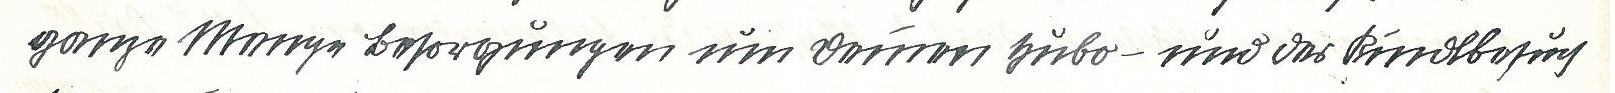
ganze Menge Besorgungen um Deinen Hubo – und der Kindlbesuch
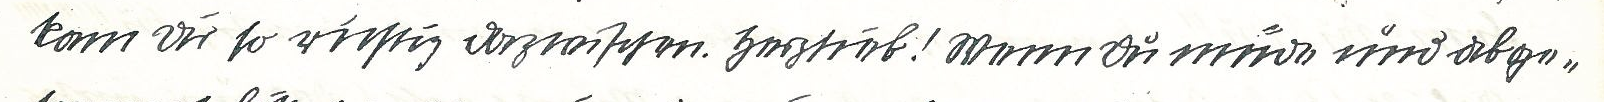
kam Dir so richtig dazwischen. Herzlieb! Wenn Du müde und abge¬
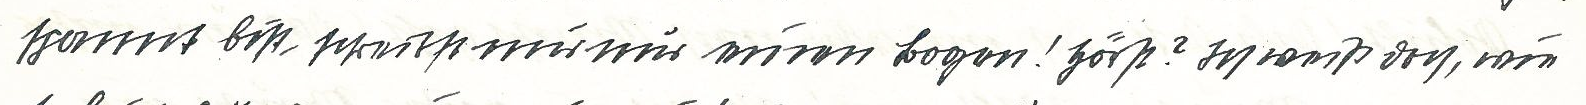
spannt bist, schreibst mir nur einen Bogen! Hörst ? Ich weiß doch, wie
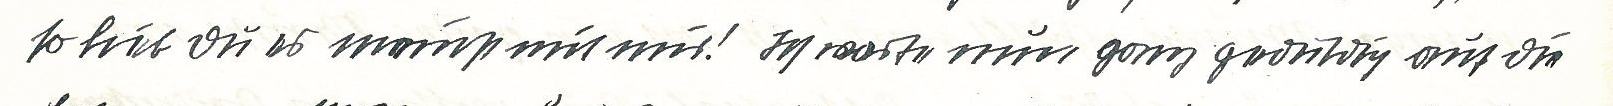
so lieb Du es meinst mit mir. Ich warte nun ganz geduldig auf die
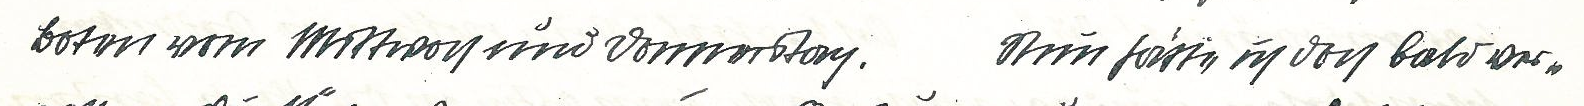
Boten vom Mittwoch und Donnerstag. Nun hätte ich doch bald ver¬
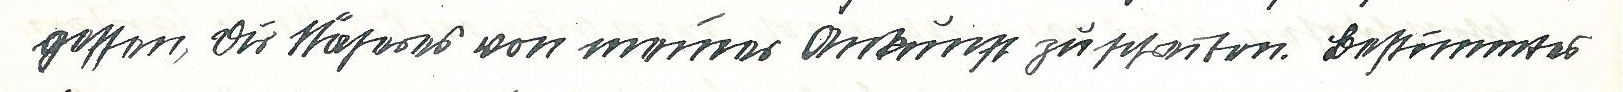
gessen, Dir Näheres von meiner Ankunft zu schreiben. Bestimmtes
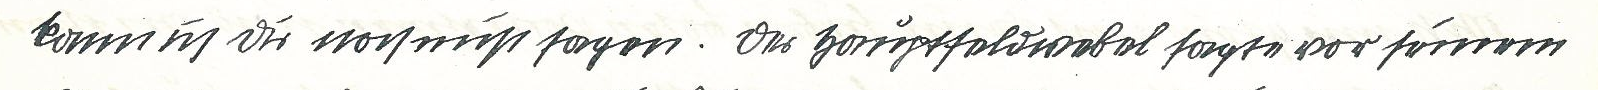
kann ich Dir noch nicht sagen. Der Hauptfeldwebel sagte vor seinem
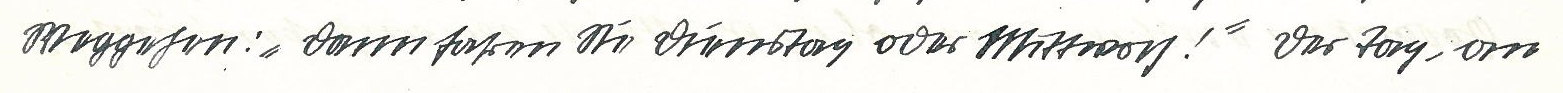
Weggehen: „Dann fahren Sie Dienstag oder Mittwoch!” Der Tag, an
